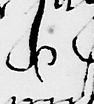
t.
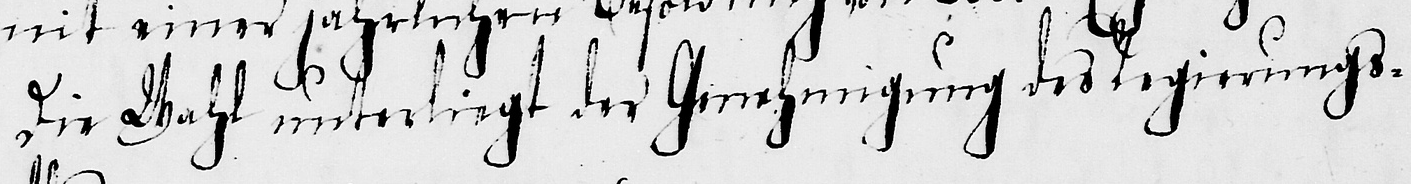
Die Wahl unterliegt der Genehmigung des Regierungs¬
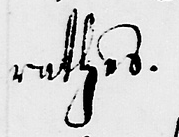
rathes.
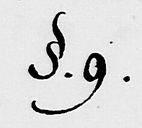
§. 9.
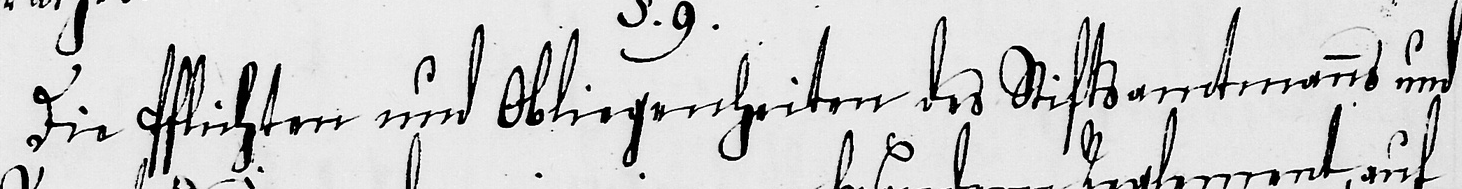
Die Pflichten und Obliegenheiten des Stiftsamtmanns und
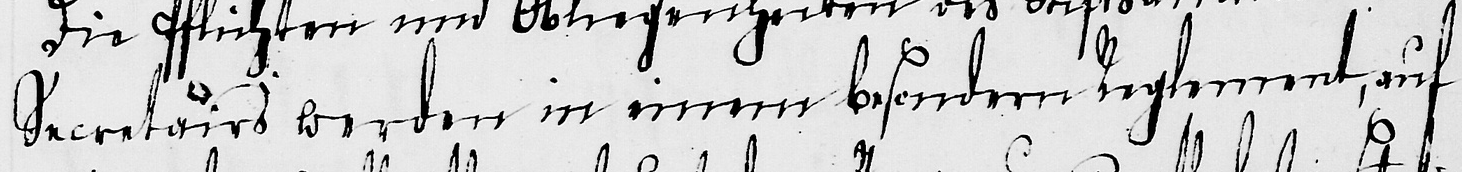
Secretairs werden in einem besondern Reglement, auf
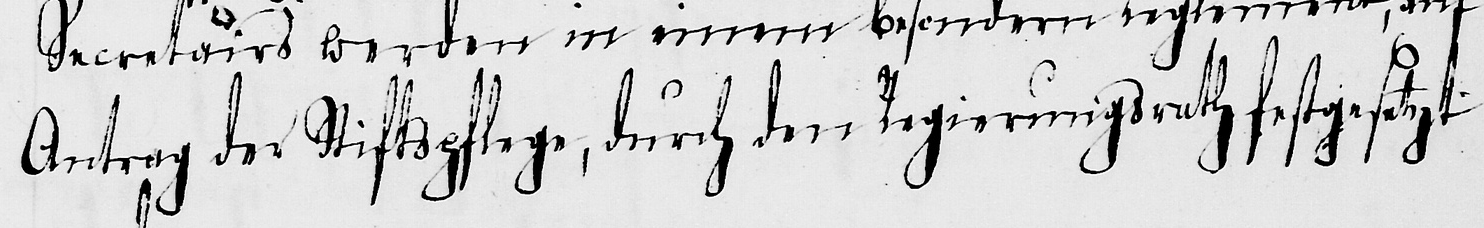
Antrag der Stiftspflege, durch den Regierungsrath festgesetzt
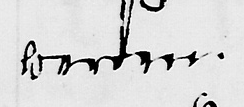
werden.
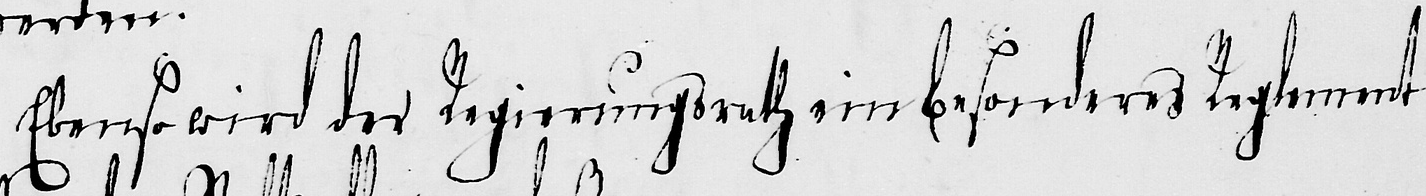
Ebenso wird der Regierungsrath ein besonderes Reglement
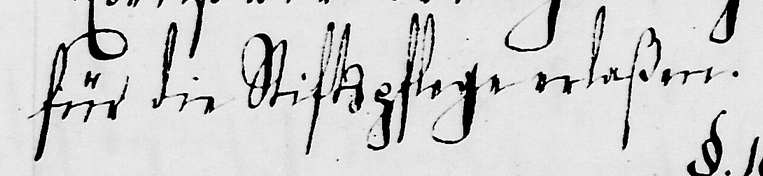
für die Spitalpflege erlaßen.
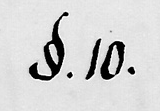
§. 10.
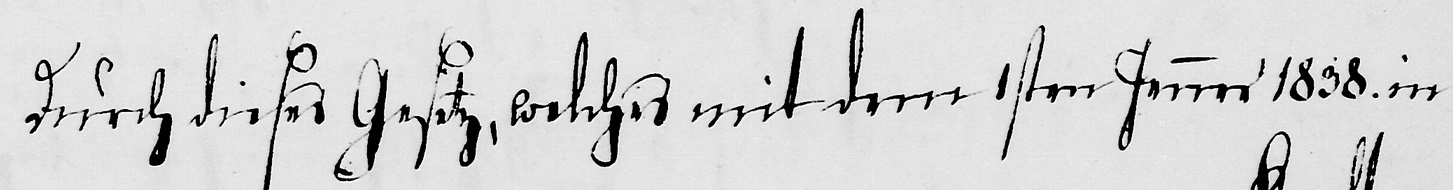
Durch dieses Gesetz, welches mit dem 1sten Jenner 1838. in
